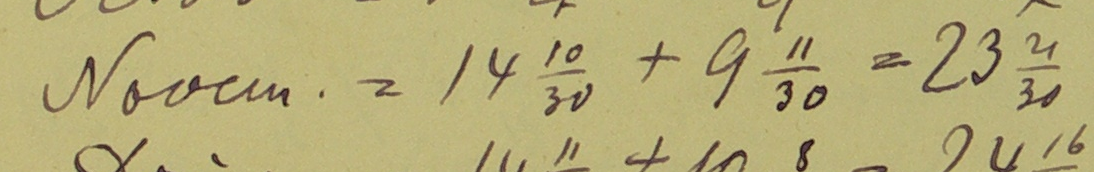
Novem. = 14 10/30 + 9 11/30 = 23 21/30
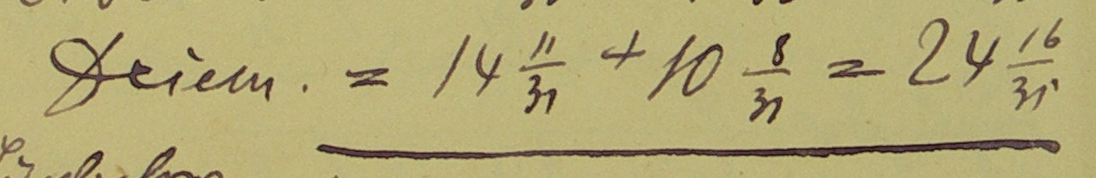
Decem. = 14 11/31 + 10 8/31 = 24 16/31
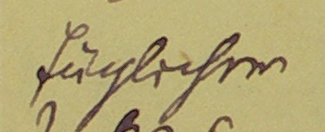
Täglicher
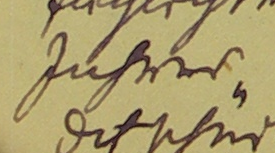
Jahres-
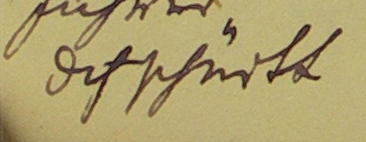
Durchschnitt
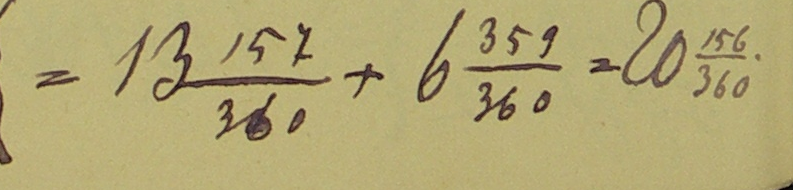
= 13 157/360 + 6 359/360 = 20 156/360
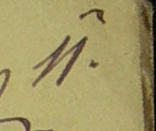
11
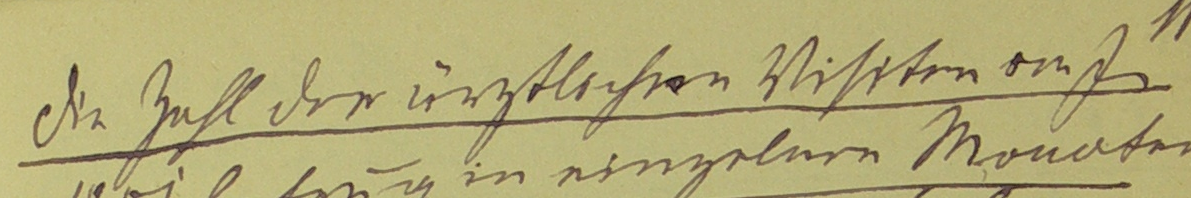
Die Zahl der ärztlichen Visiten im Jahr
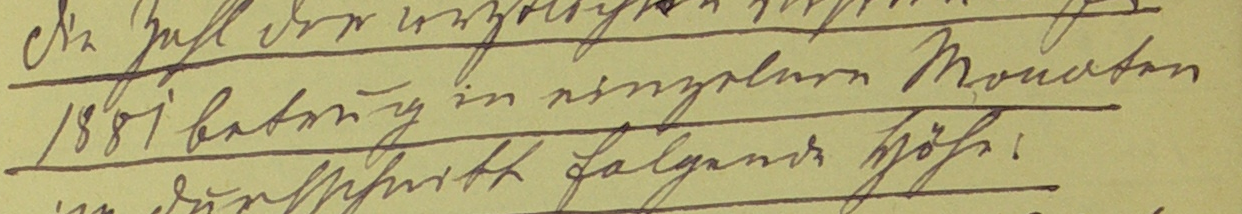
1881 betrug in einzelnen Monaten
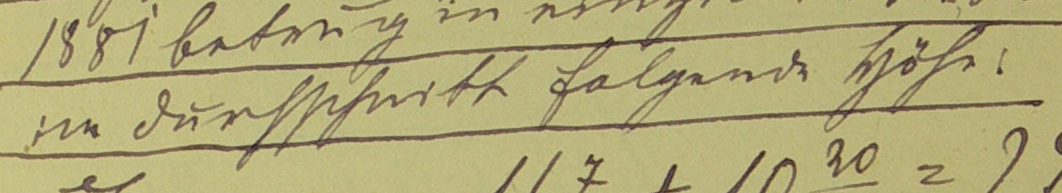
im Durchschnitt folgende Höhe:
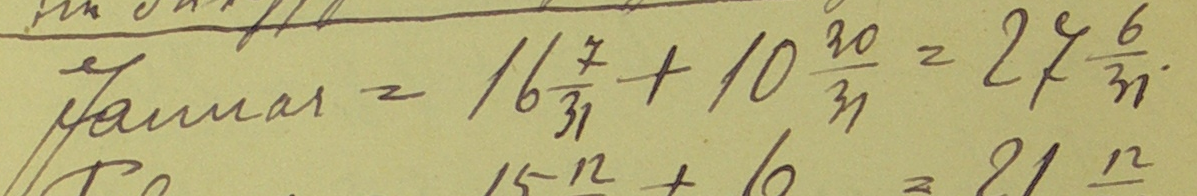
Januar = 16 //31 + 10 30/31 = 27 6/31
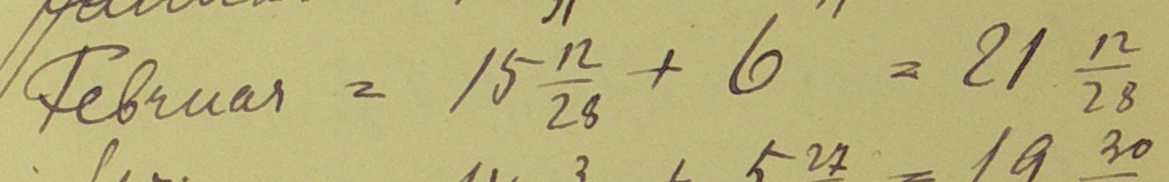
Februar = 15 12/28 + 6 = 21 12/28
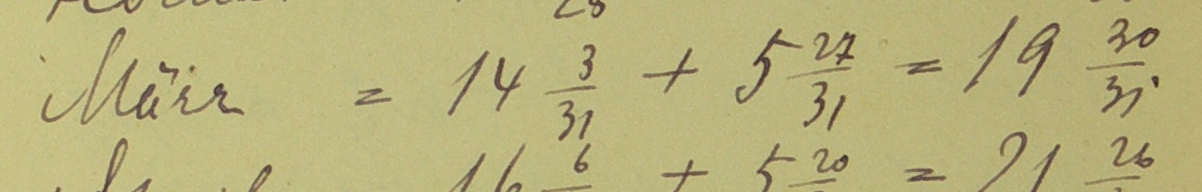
März = 14 3/31 + 5 27/31 = 19 30/31
